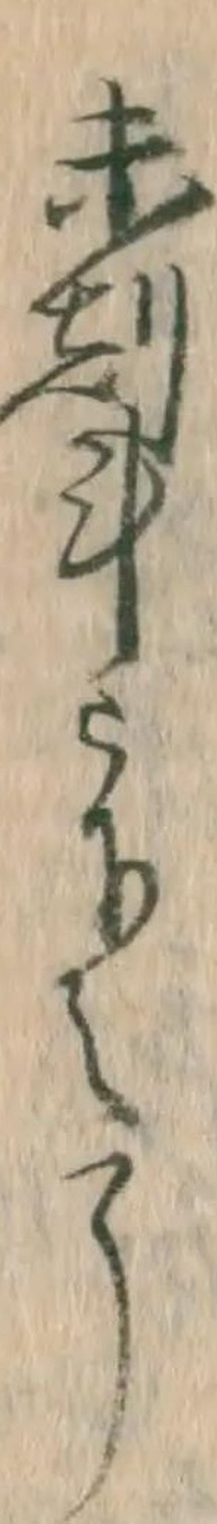未刻斗被下之了
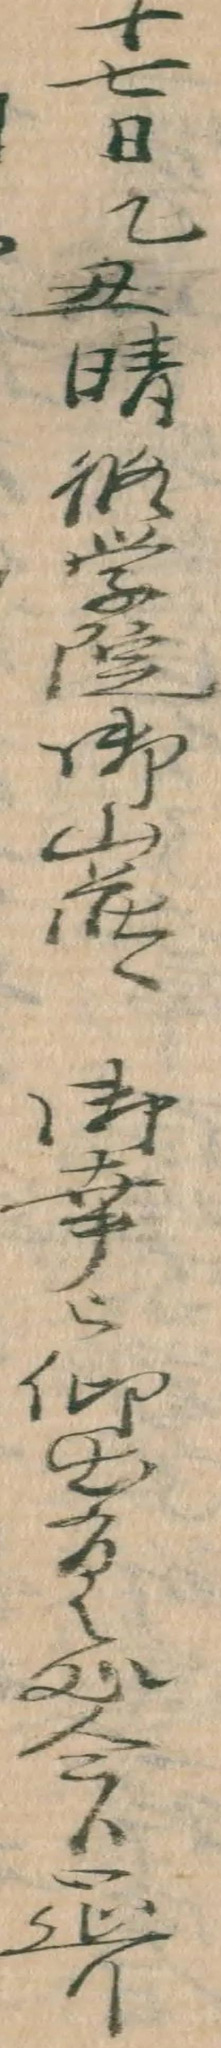十七日乙丑晴修学院御山荘へ御幸被仰出有之処今日御延引
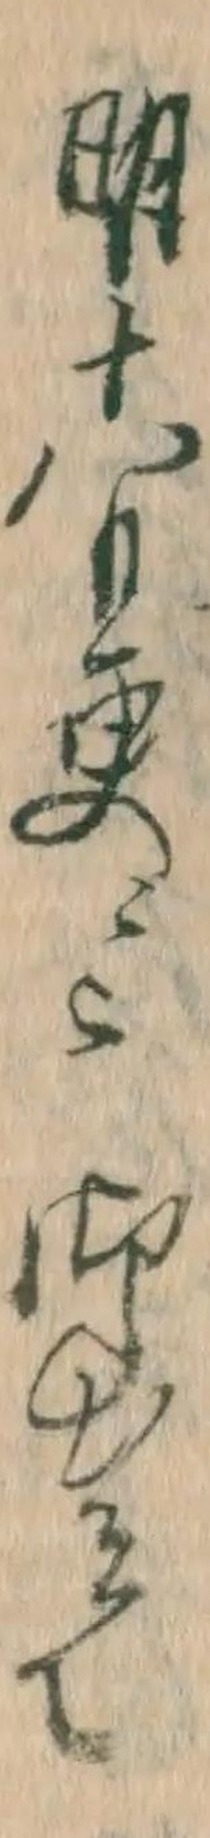明十八日更ニ被仰出云々
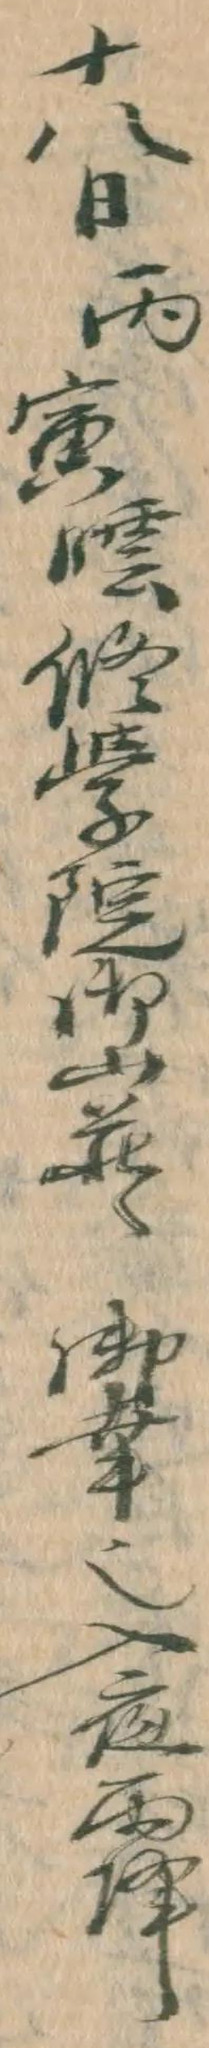十八日丙寅曇修学院御山荘へ御幸也入夜雨降
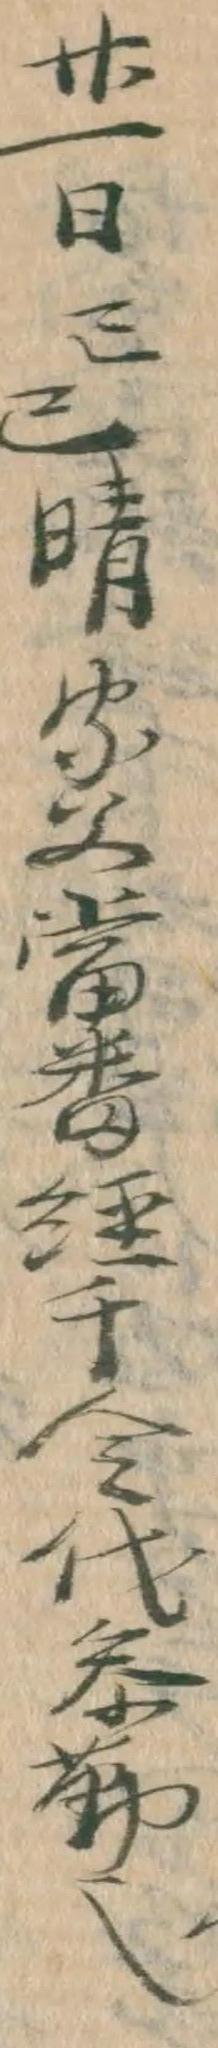廿一日己巳晴家父當番経千令代参勤了
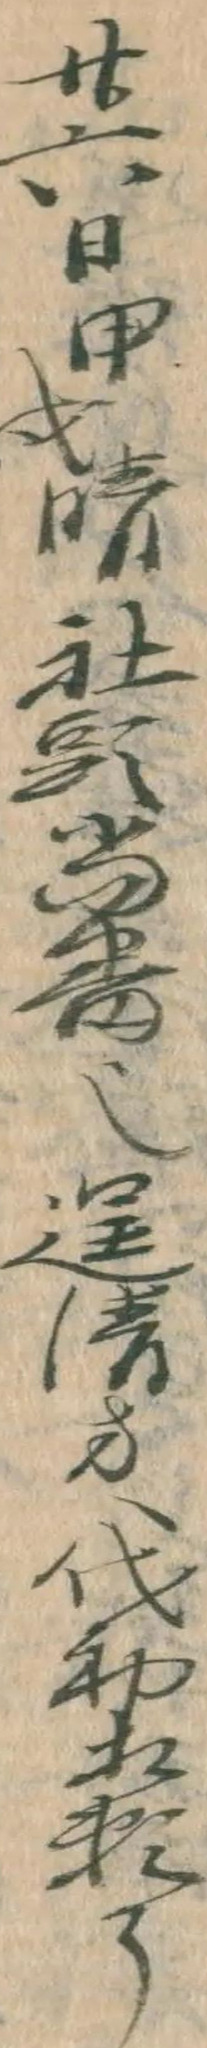廿六日甲戌晴社頭當番也逞清方へ代勤相頼了
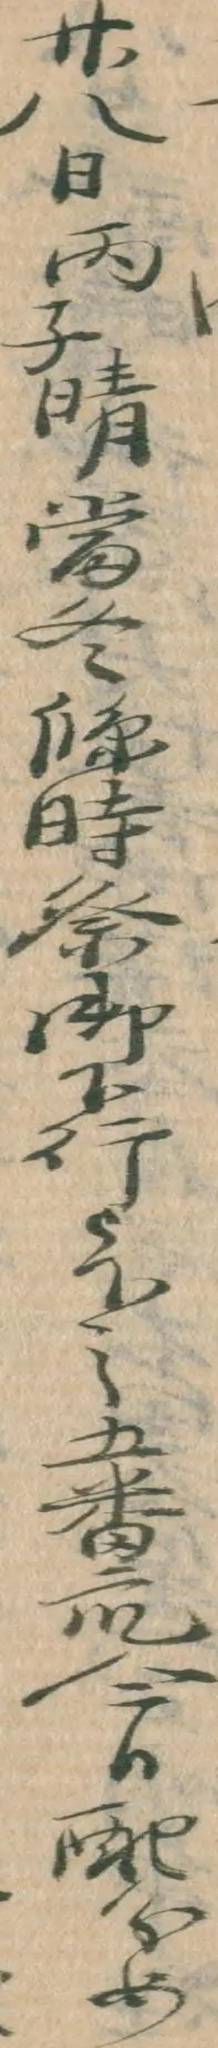廿八日丙子晴當冬臨時祭御下行被下也五番衆今日配分如
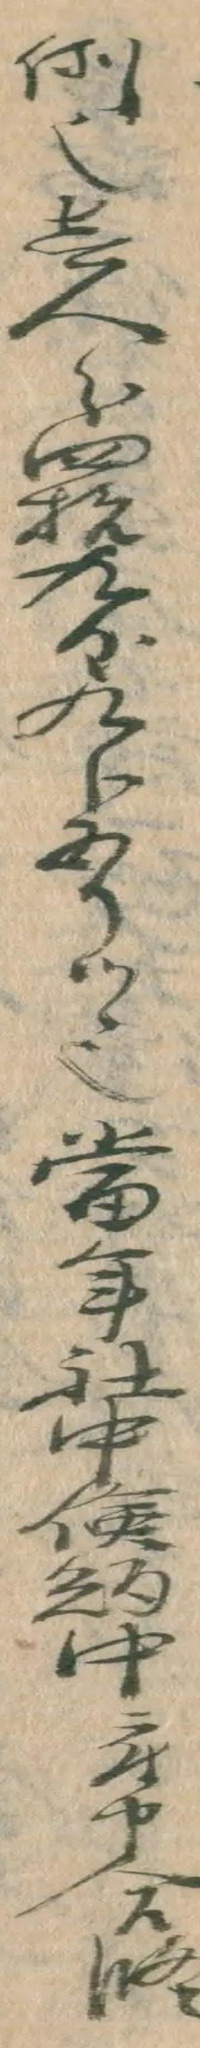例也壱人分四拾九匁九分五りツヽ也當年社中倹約中ニ付申合修
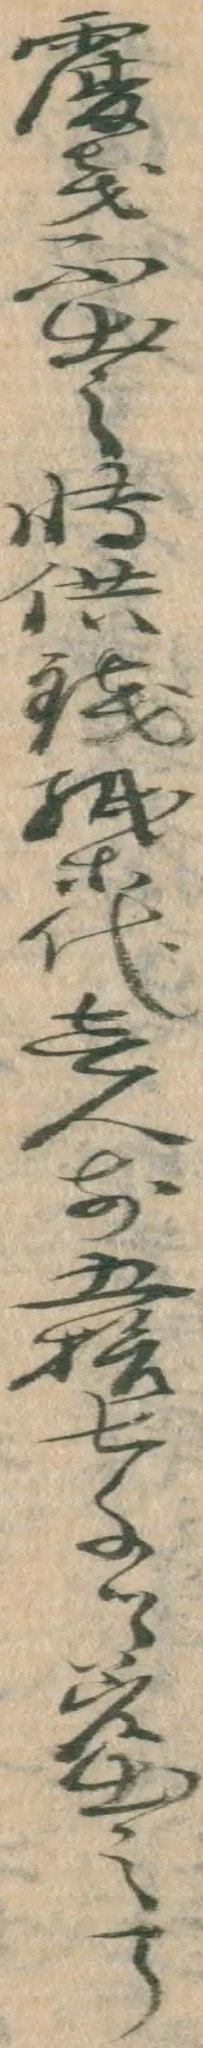覆曳不出之轉供銭紙等代壱人前五拾七匁ツヽ差出之了
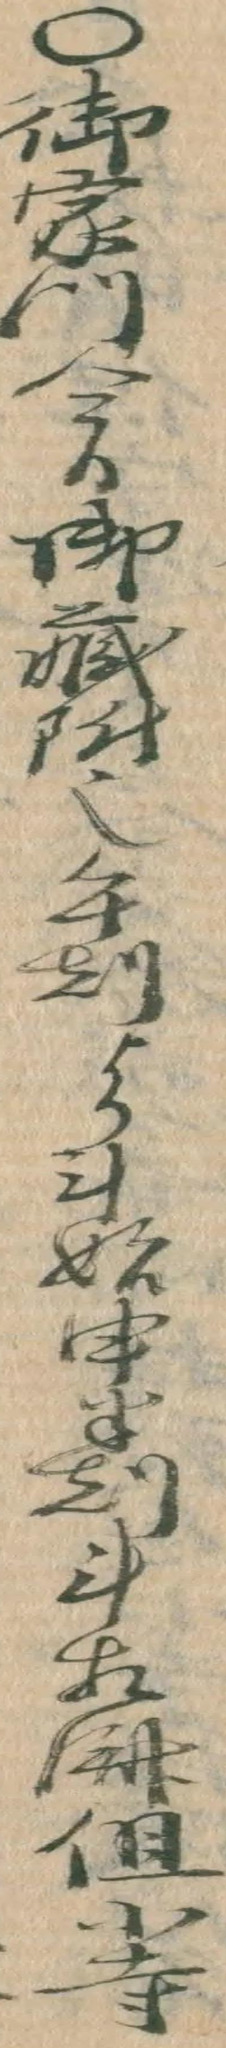○御家門今日御蔵附也午刻より斗始申半刻斗相済但小寺
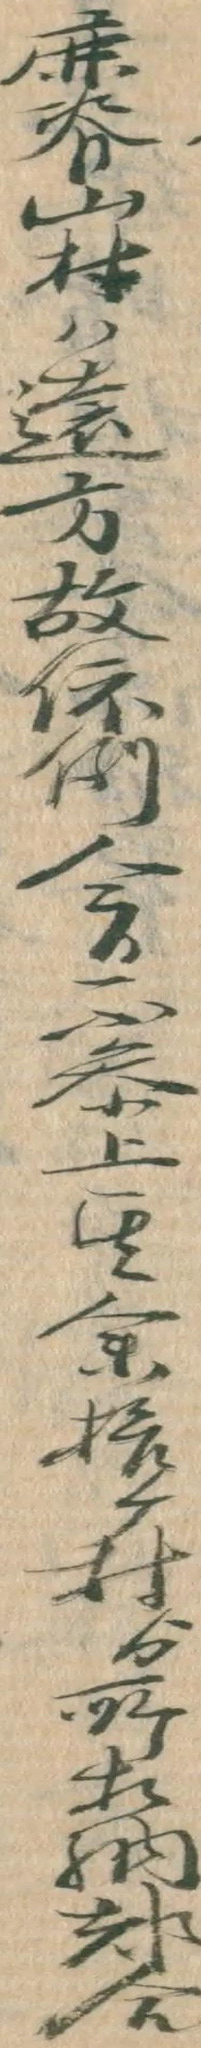鹿脊山林ハ遠方故依例今日不参上其余拾ケ村ゟ所相納都合
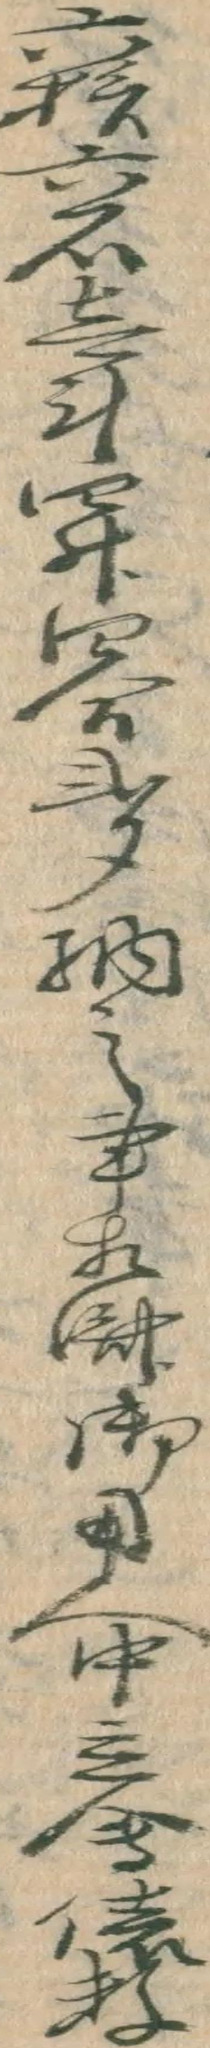六拾六石壱斗四升四合弐勺納之事相済御用人中立會俵数
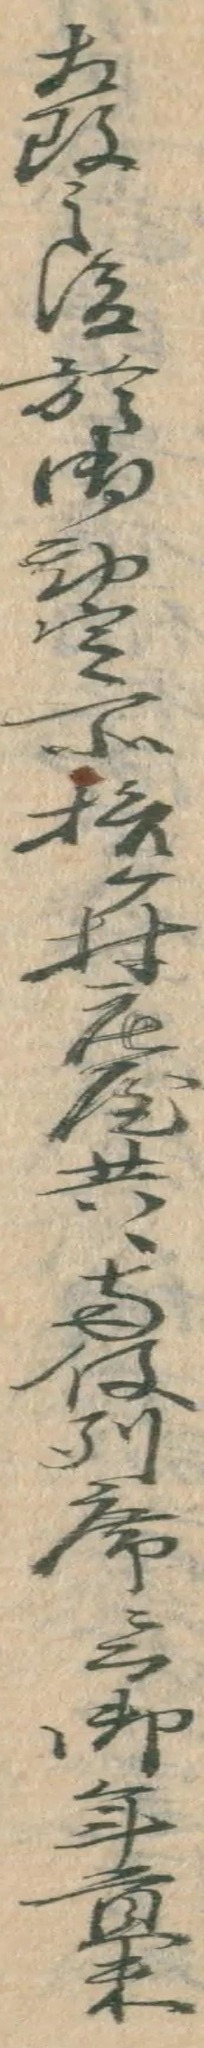相改之後於御勘定所拾ケ村庄屋共へ両役列席ニ而御年貢米
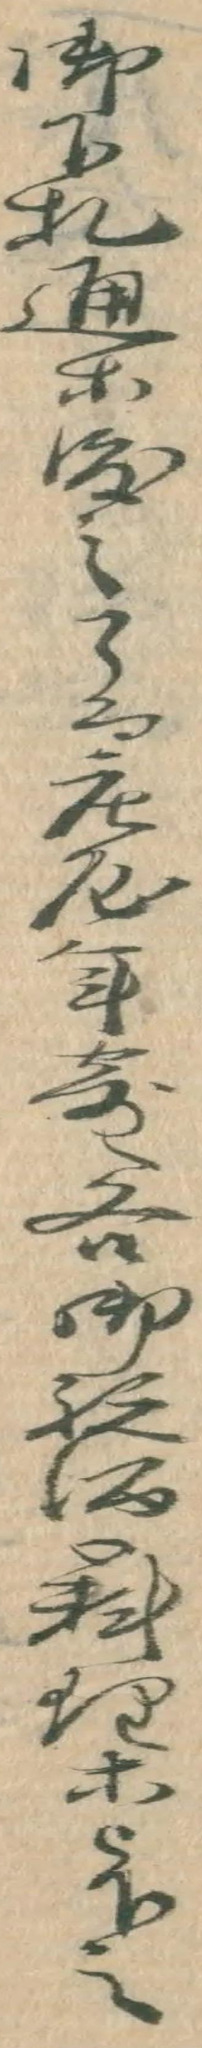御下札通等渡之了而庄屋年寄へ各御祝酒御料理等被下之
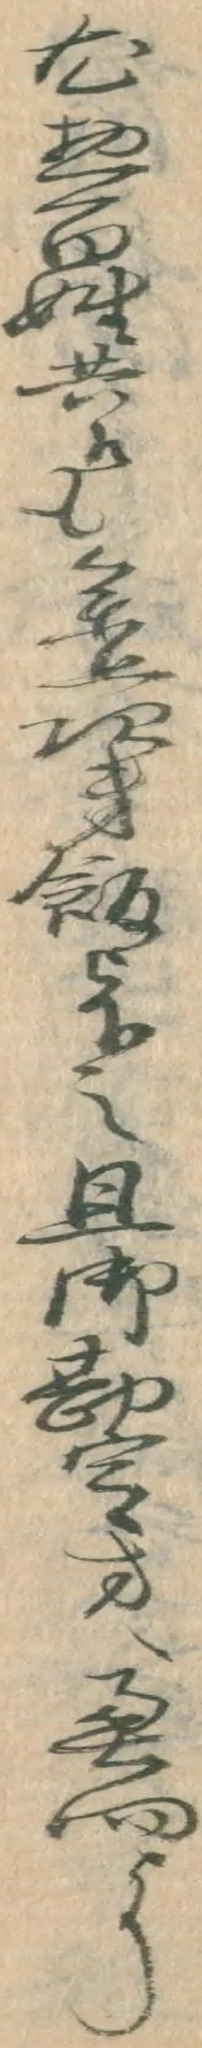尤惣百姓共えも参上次第飯被下之且御勘定方へ奥向より

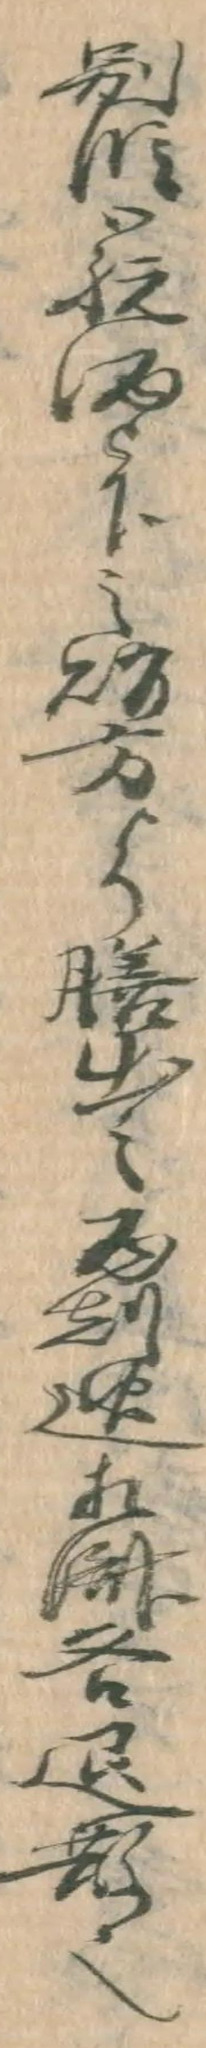別段御祝酒被下之賄方より膳出之酉刻迎相済各退散也
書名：賀茂社記録. 第65冊
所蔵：国立国会図書館 National Diet Library, JAPAN
